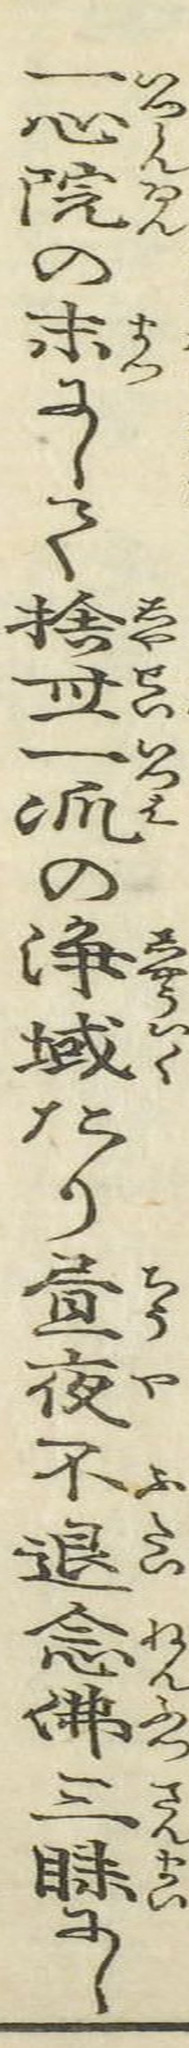一心院の末にして捨世一派の浄域たり昼夜不退念仏三昧にし
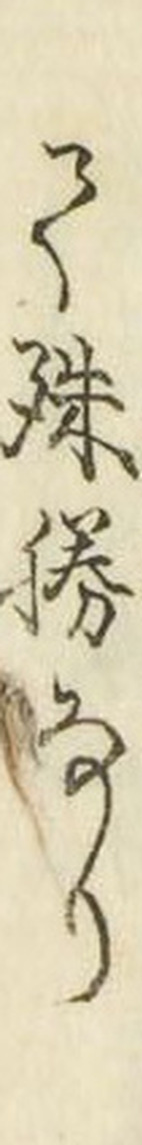て殊勝なり
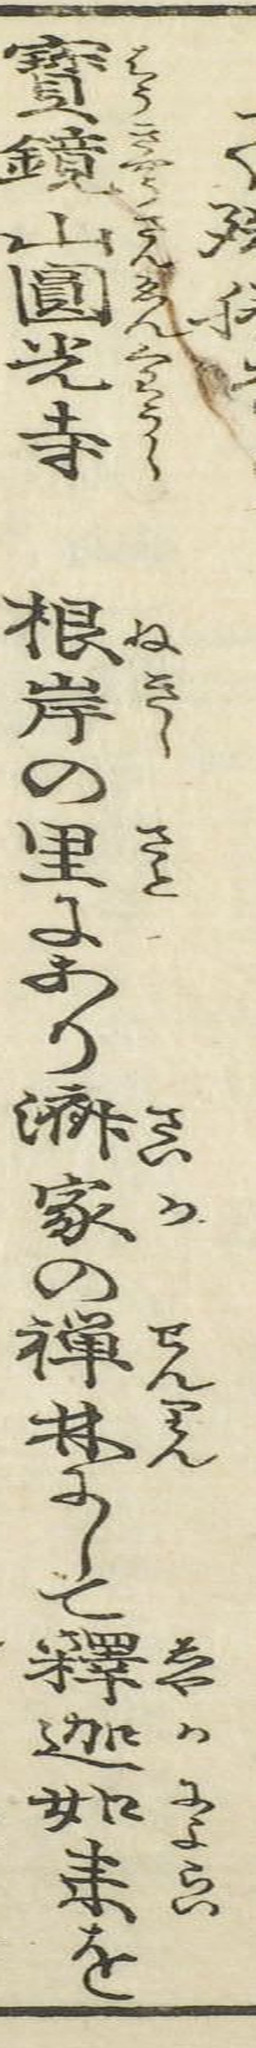宝鏡山円光寺根岸の里にあり済家の禅林にして釈迦如来を
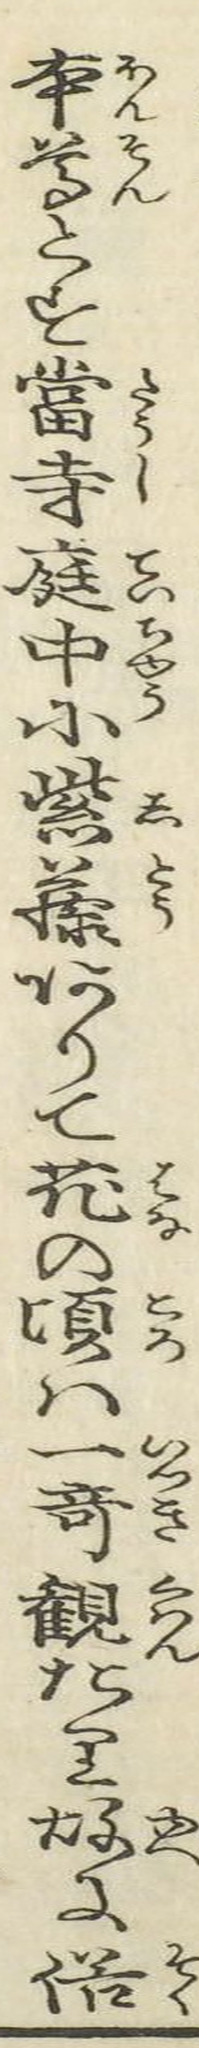本尊とす当寺庭中に紫藤ありて花の頃は一奇観たり故に俗
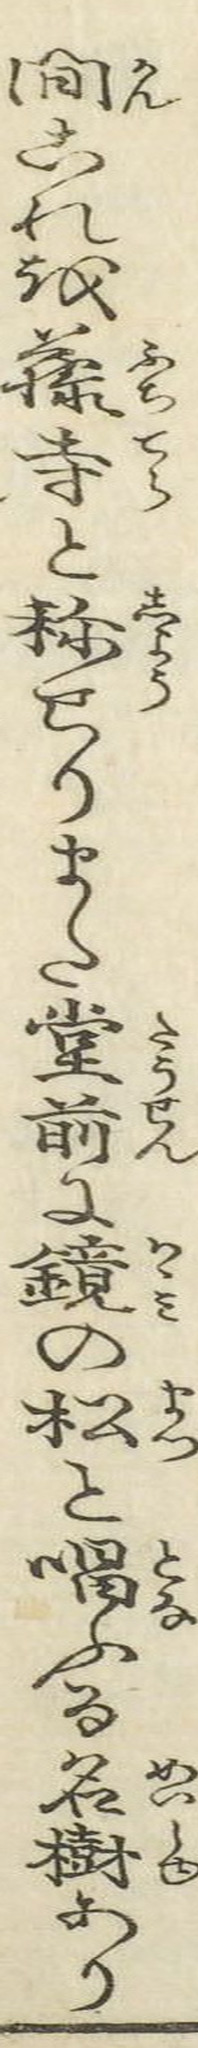間これを藤寺と称せりまた堂前に鏡の松と唱ふる名樹あり
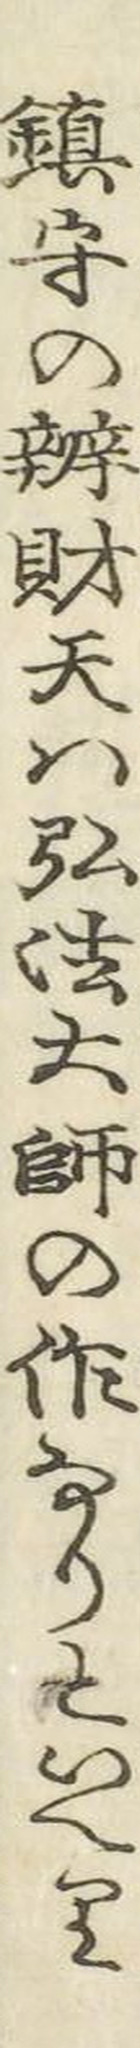鎮守の弁財天は弘法大師の作なりといへり
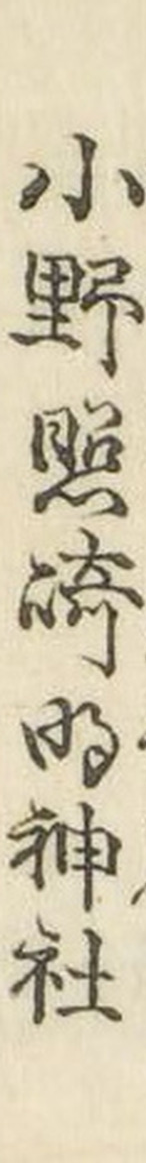小野照崎明神社
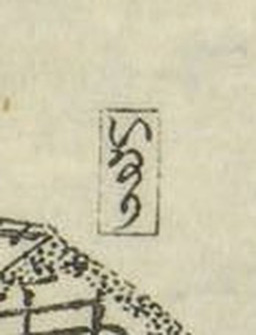いなり

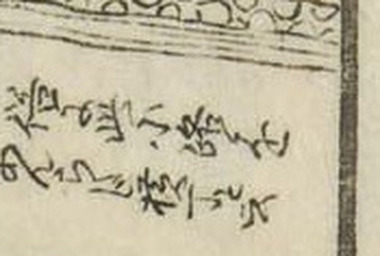俗に此小路を

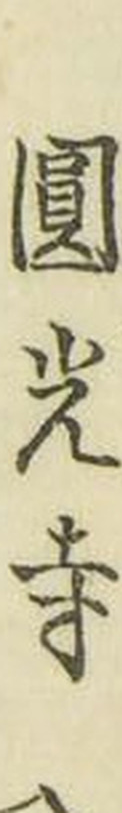円光寺
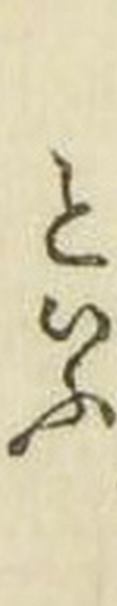といふ
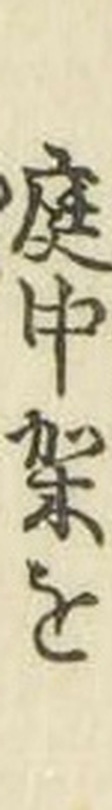庭中架を
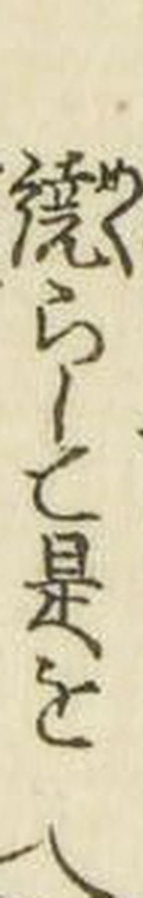繞らして是を
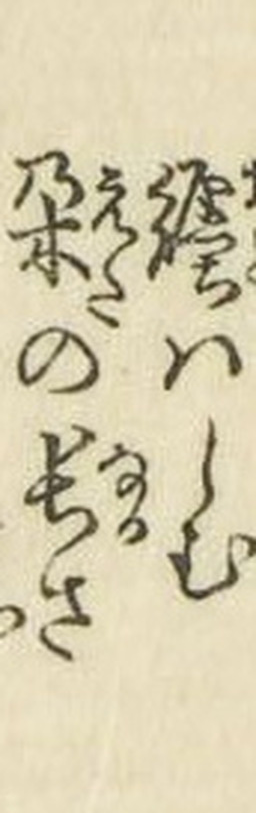朶の長さ
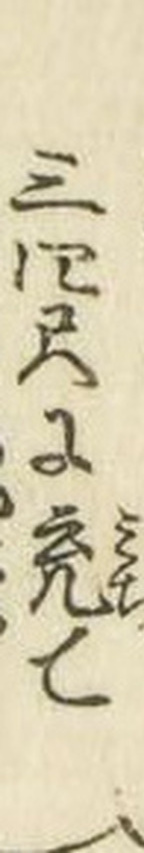三四尺に充て

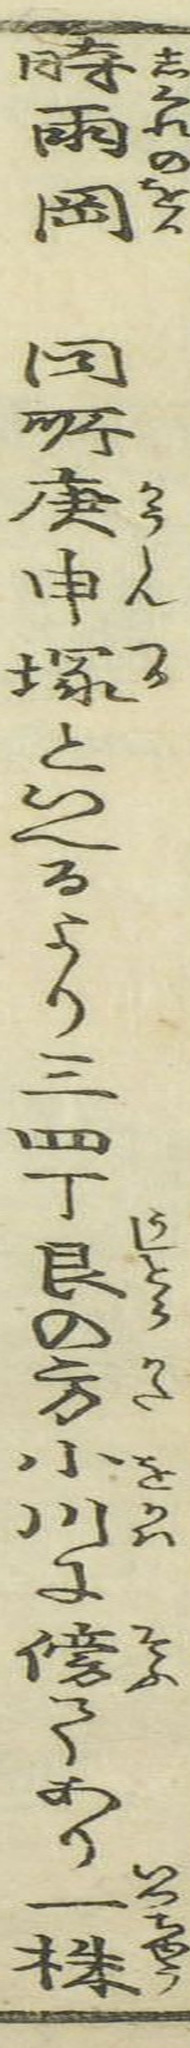時雨岡同所庚申塚といへるより三四丁艮の方小川に傍てあり一株
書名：江戸名所図会 20巻 巻之17
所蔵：東京学芸大学教育コンテンツアーカイブ
